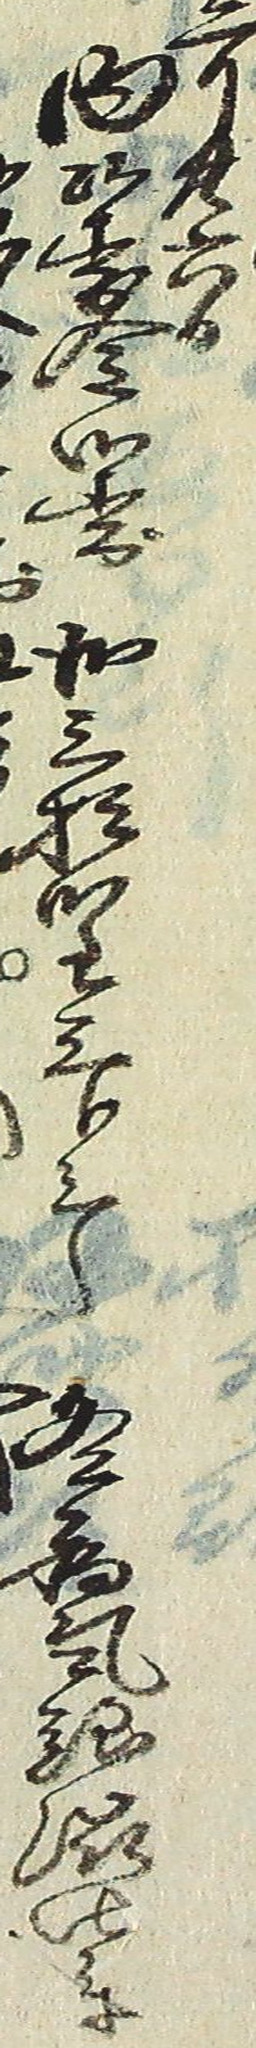内弐歩金弐歩代三拾弐匁三分三厘冬病気難渋仕付
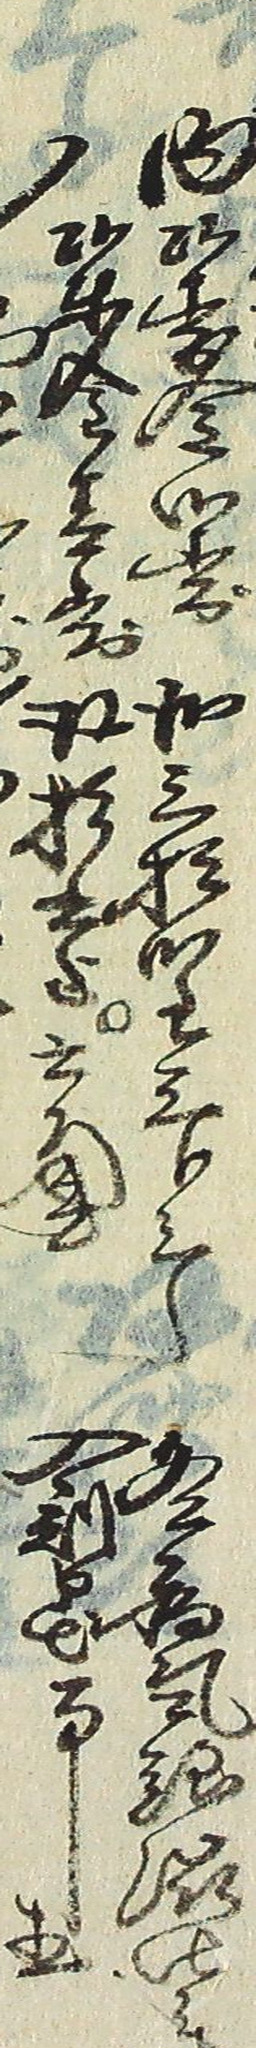弐朱金壱歩代拾六匁〇六厘入割申出予直
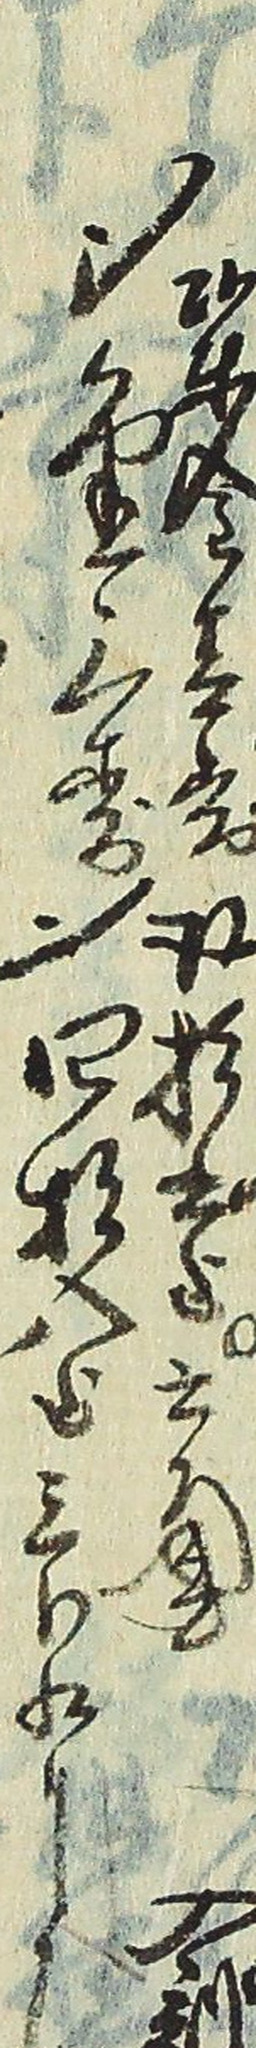〆金三歩〆四拾八匁三分九厘也
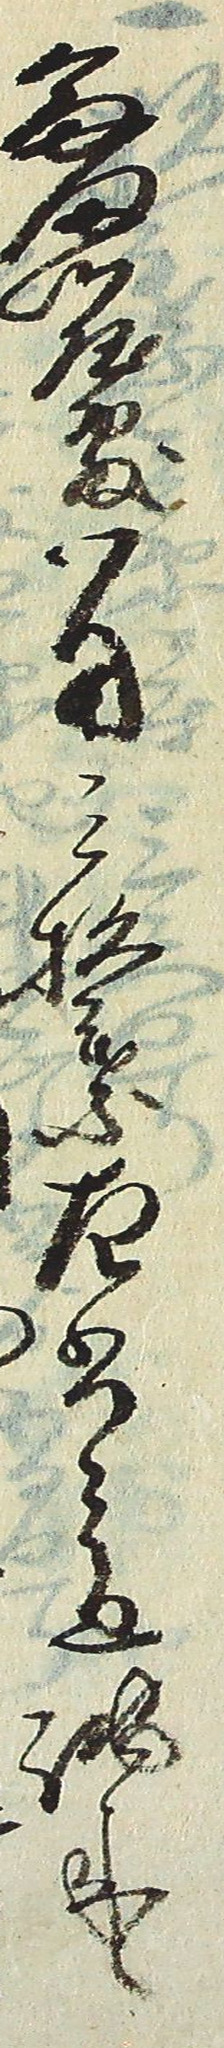富田御屋敷御用之杉葉左書之通誂来候
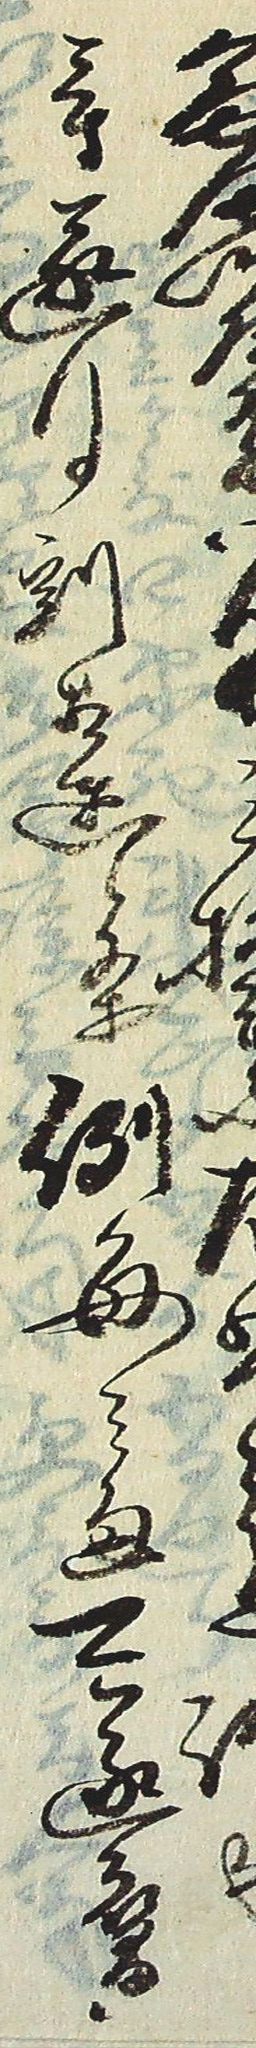に付遂月割相達候条例毎之通可遂了簡
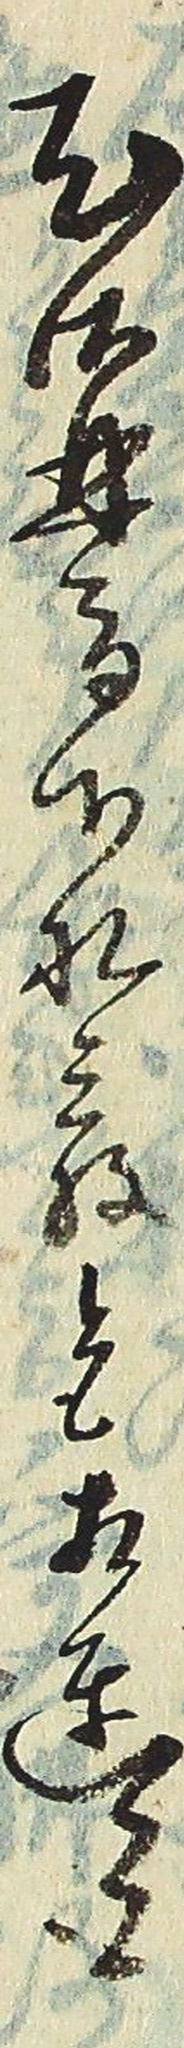尤御林方下札三枚とも相達候以上
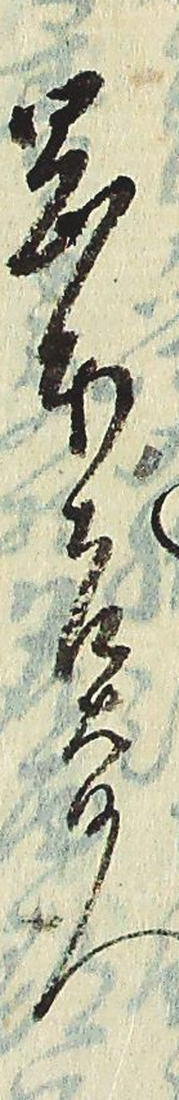岡本吉右衛門
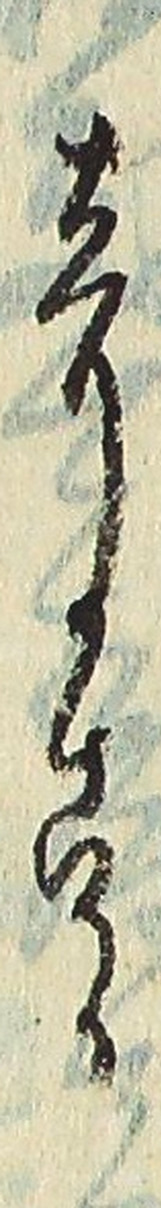十二月十四日
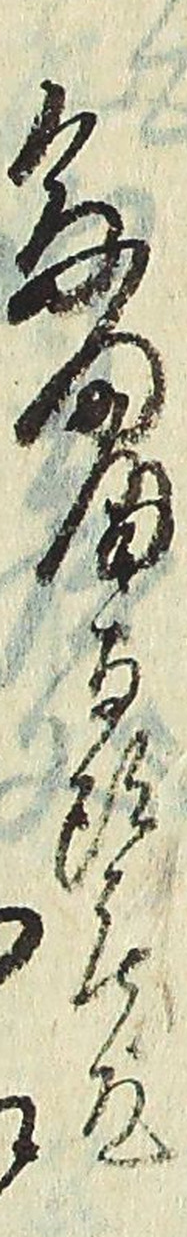冨田浦与頭庄屋
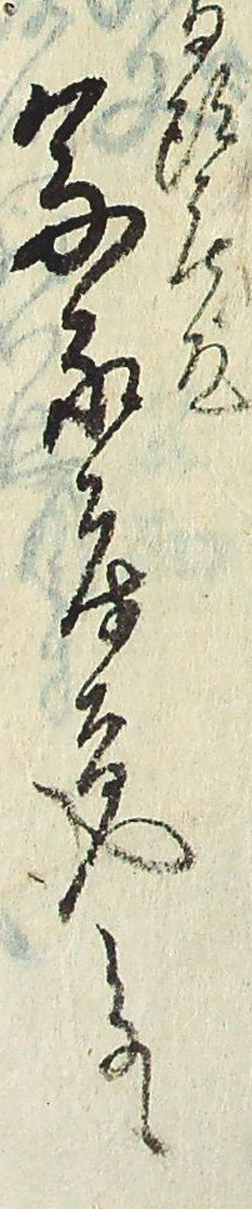富永茂右衛門とのへ

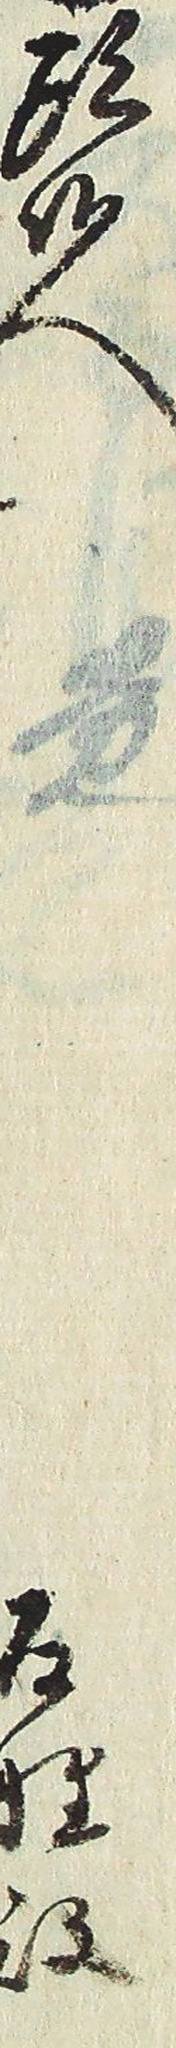一頭弐人百姓役
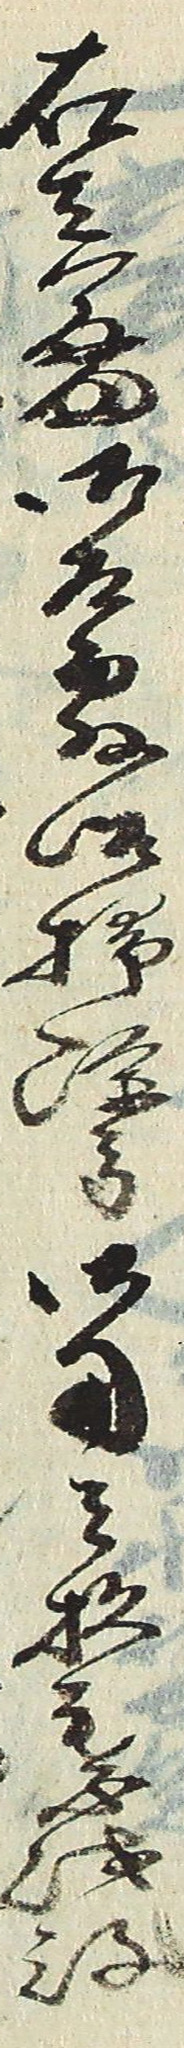右は富田御屋敷御掃除方御用之杉葉越役
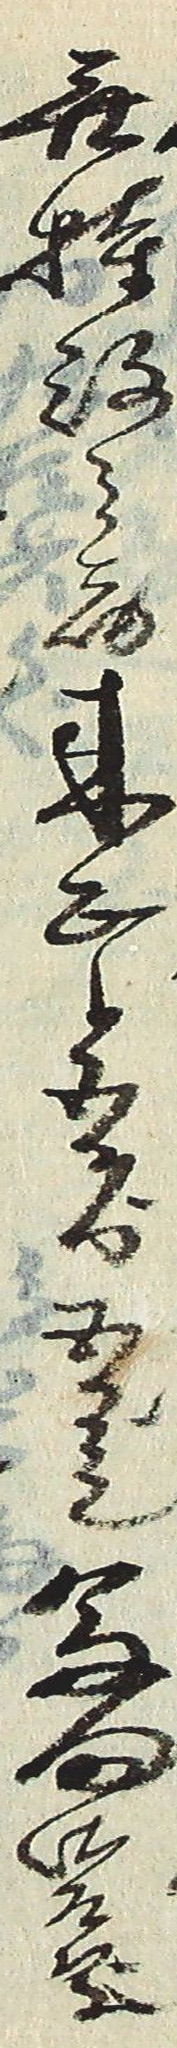并持役之者来正月五日ゟ五日廻富田御屋敷
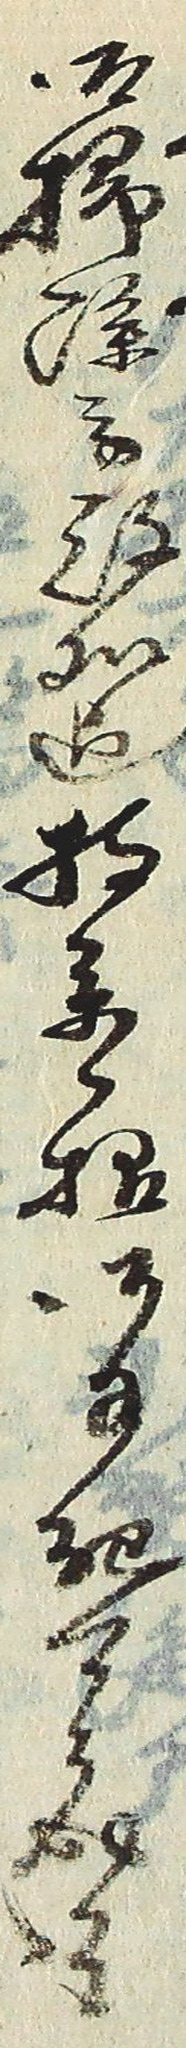御掃除方役処迄持参候様御手配可被成候以上
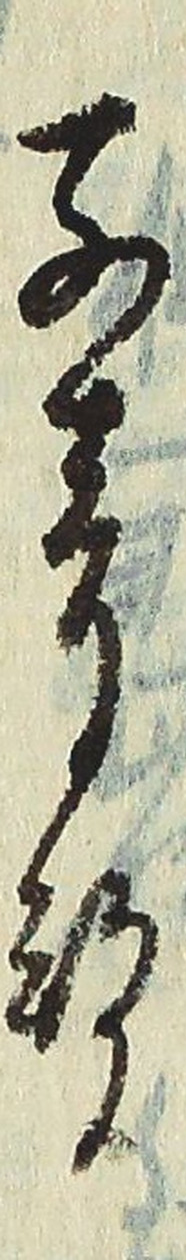子十二月朔日
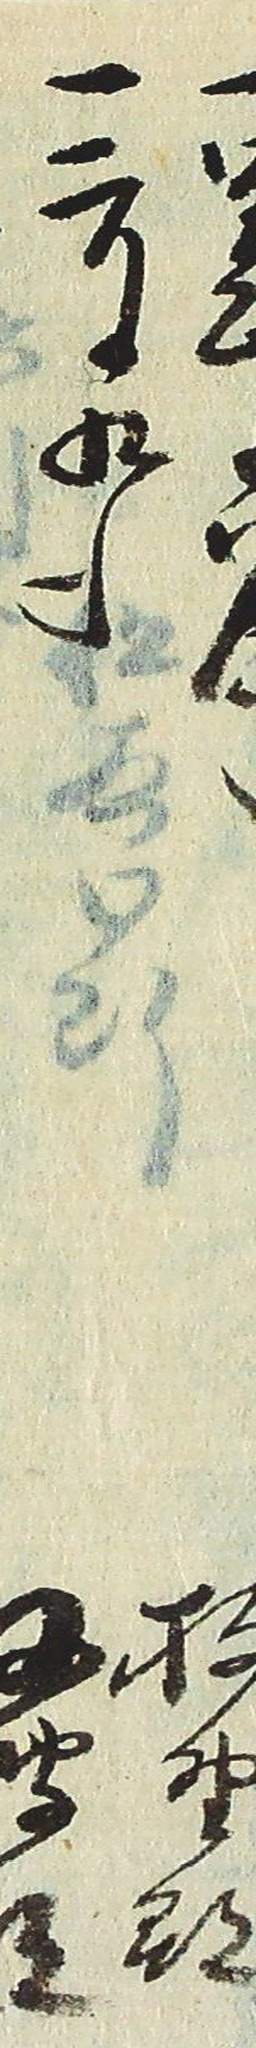一二月九月阿波郡
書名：名東郡中諸割賦元帳
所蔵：鳴門教育大学 Naruto University of Education
